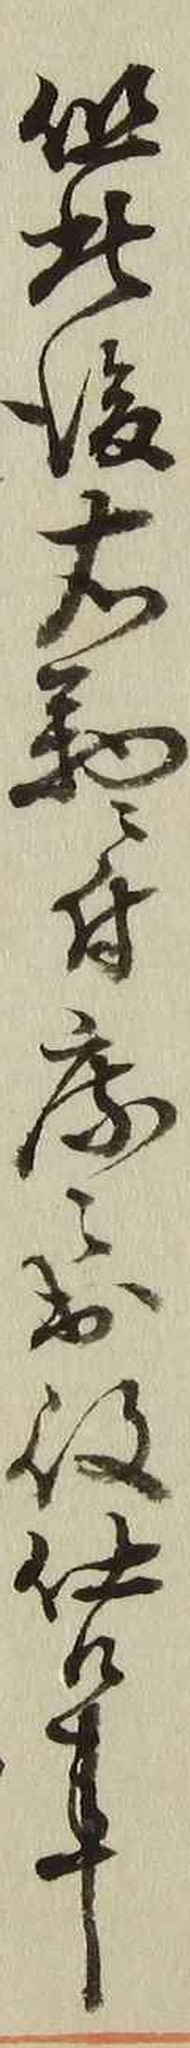但此後右勤ニ付度々出役仕候事
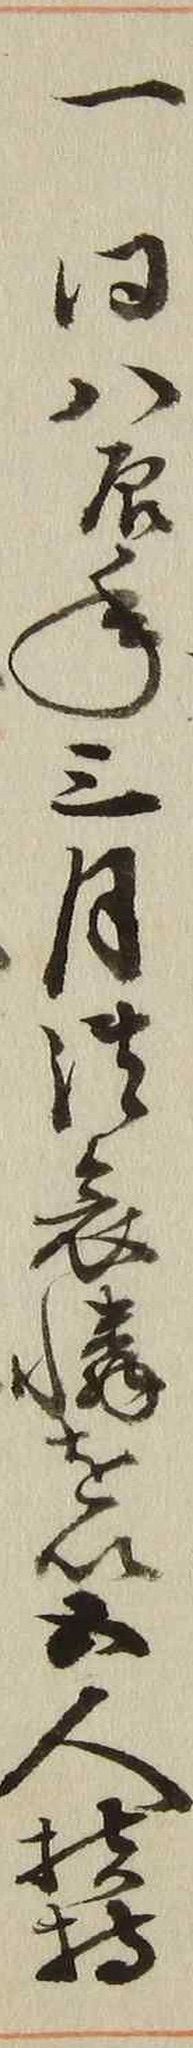一同八辰年三月御哀憐を以五人扶持
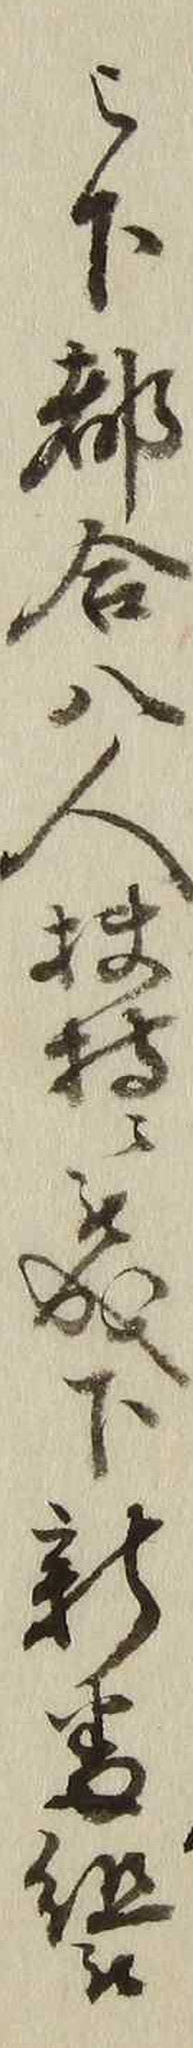被下都合八人扶持ニ被成下新番組被
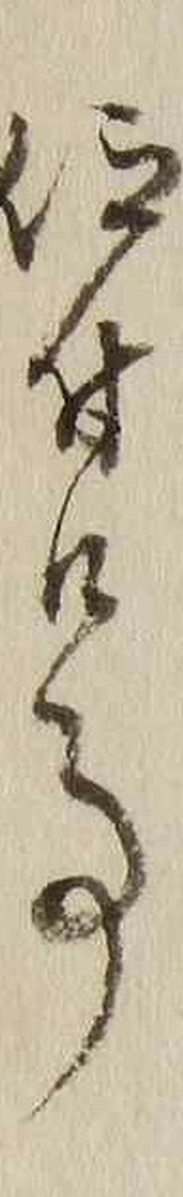仰付候事
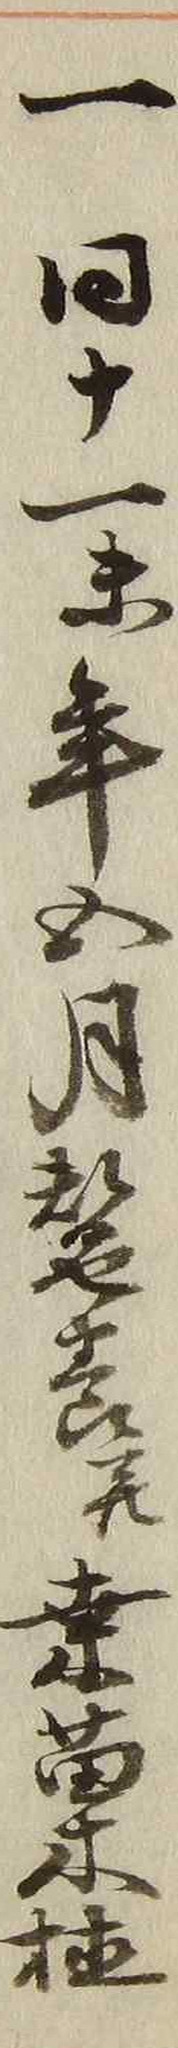一同十一未年五月蚕養并桑苗木植
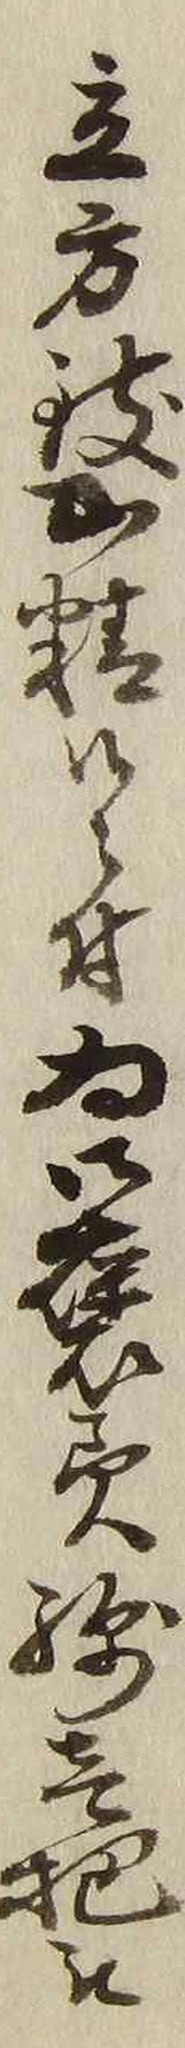立方致出精候ニ付為御褒美綿壱把被
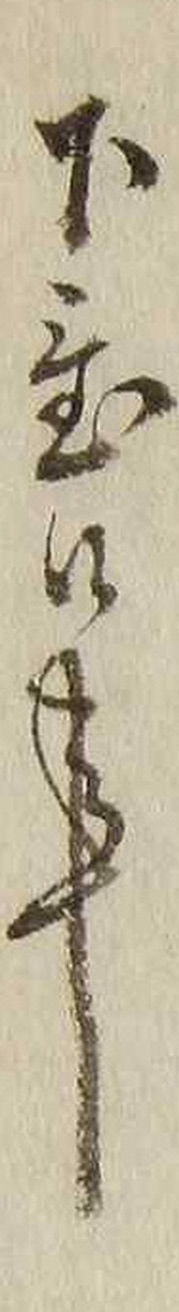下置候事
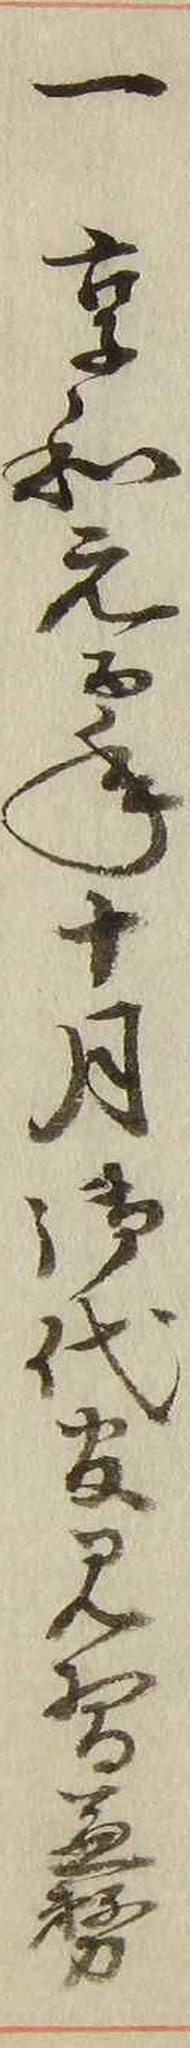一享和元酉年十月御代官見習兼務

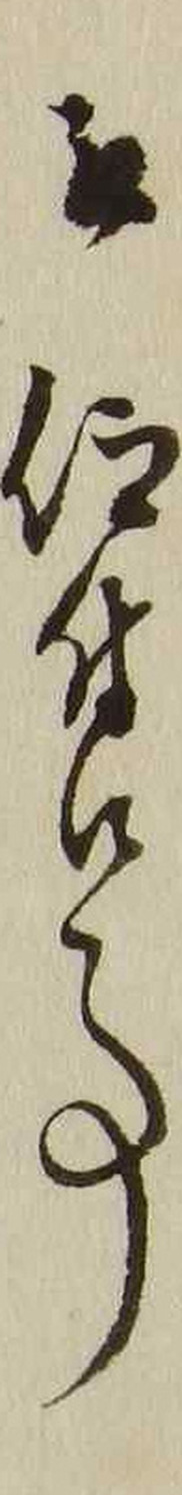被仰付候事
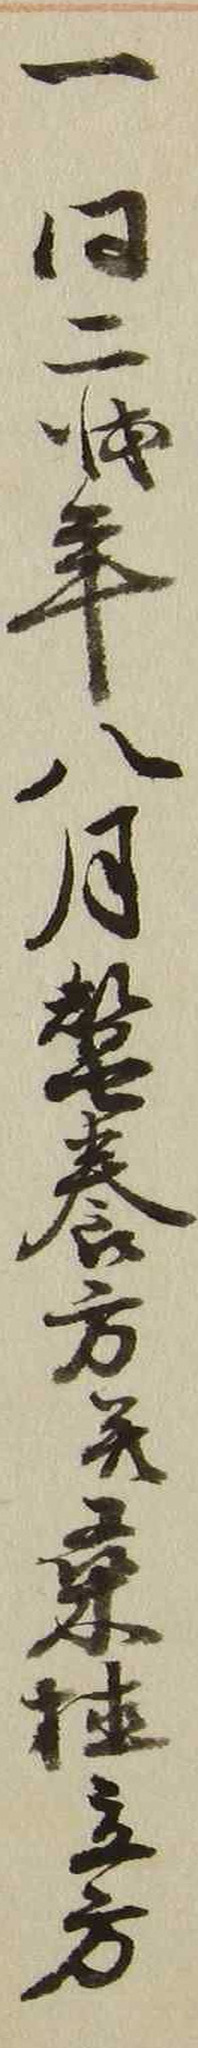一同二戌年八月蚕養方幷桑立方
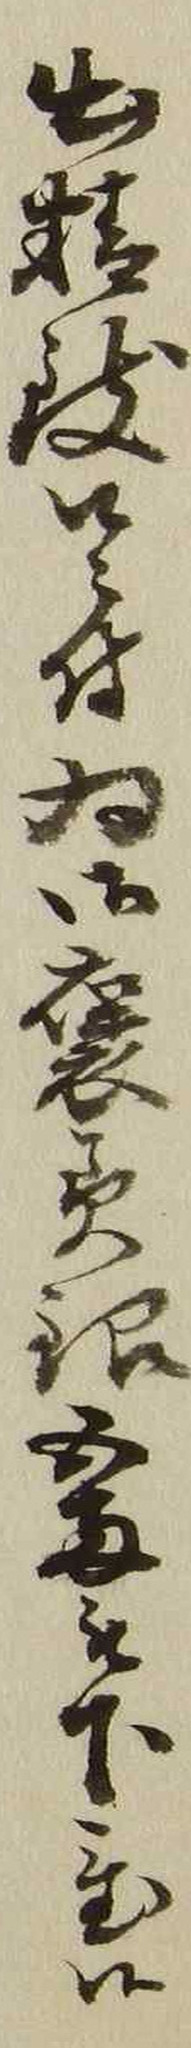出精致候ニ付為御褒美銀五両被下置候
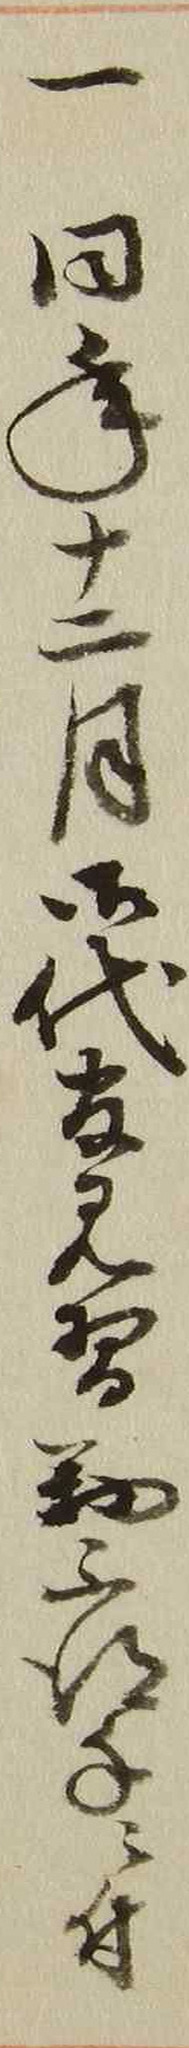一同年十二月御代官見習勤不得手ニ付
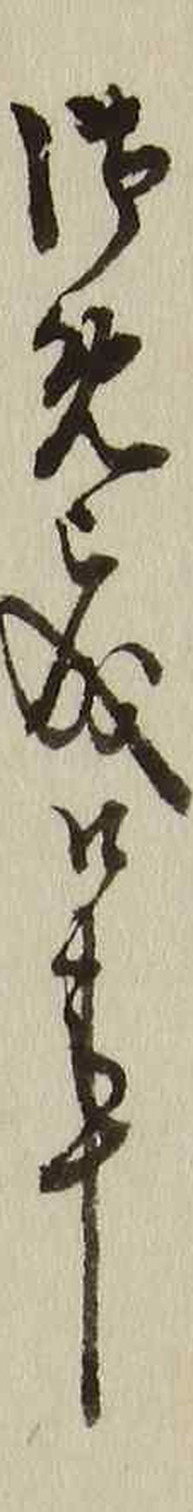御免被成候事
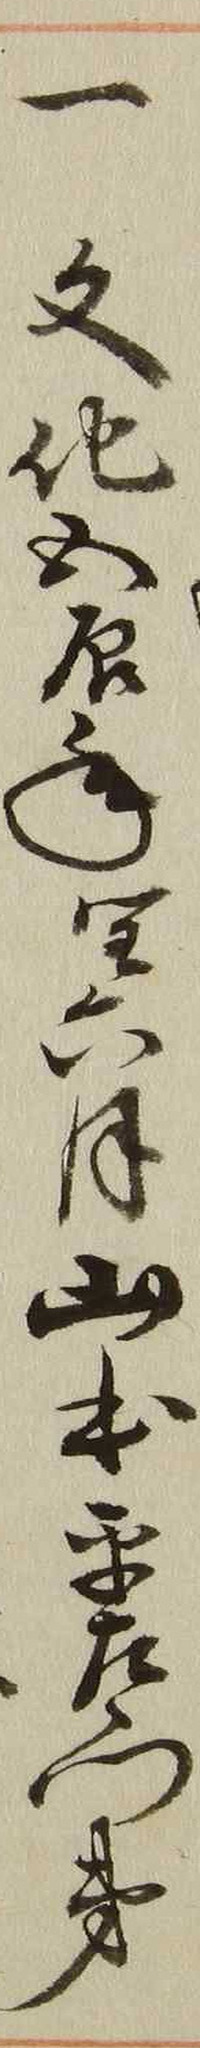一文化五辰年閏六月山本平左衛門弟
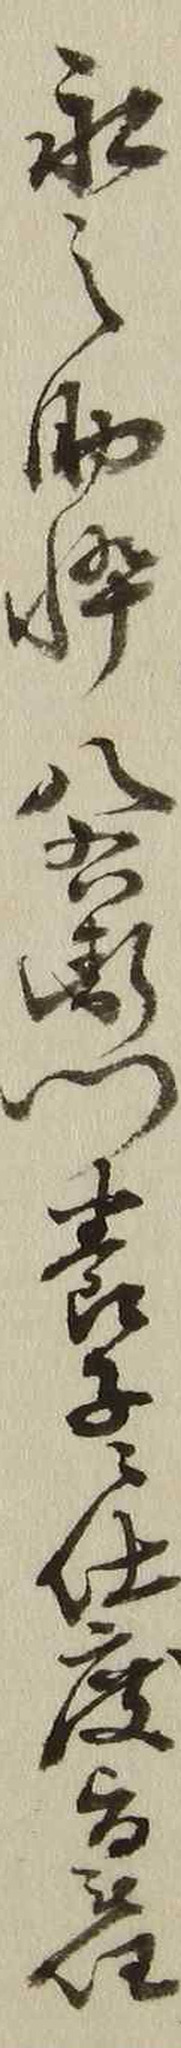永之助忰八右衛門養子ニ仕度旨被任
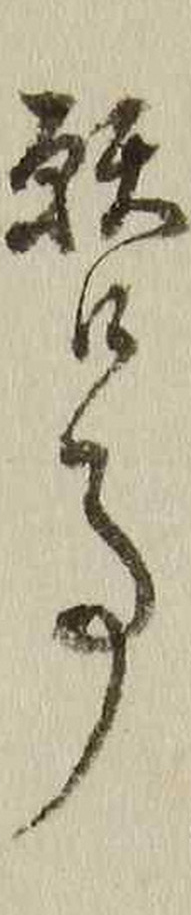願候事
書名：諸士系譜　巻之31　い之部31
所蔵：会津若松市立会津図書館
